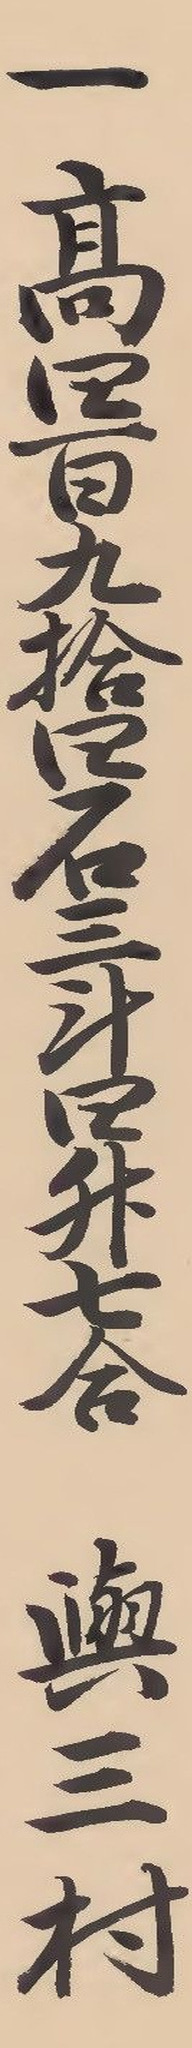一高四百九拾四石三斗四升七合与三村
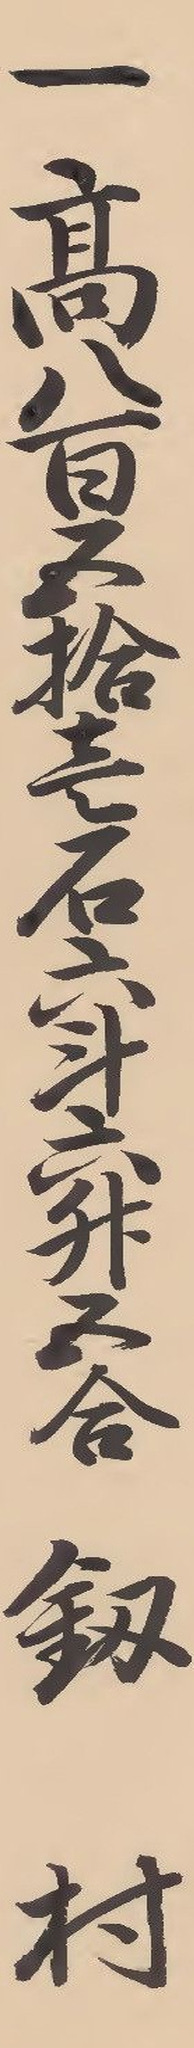一高八百五拾壱石六斗六升五合剣村
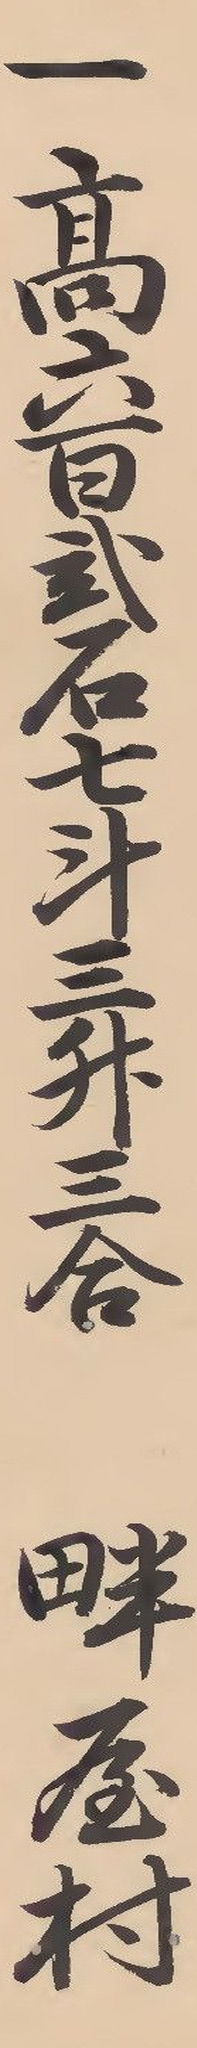一高六百弐石七斗三升三合畔屋村

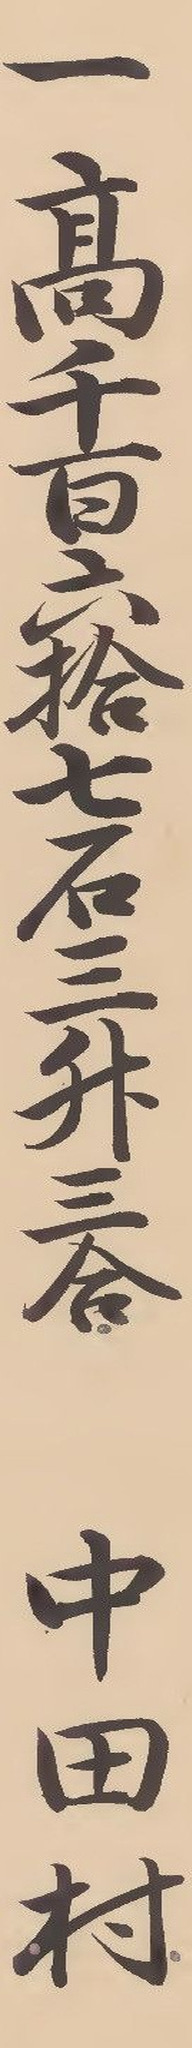一高千百六拾七石三升三合中田村
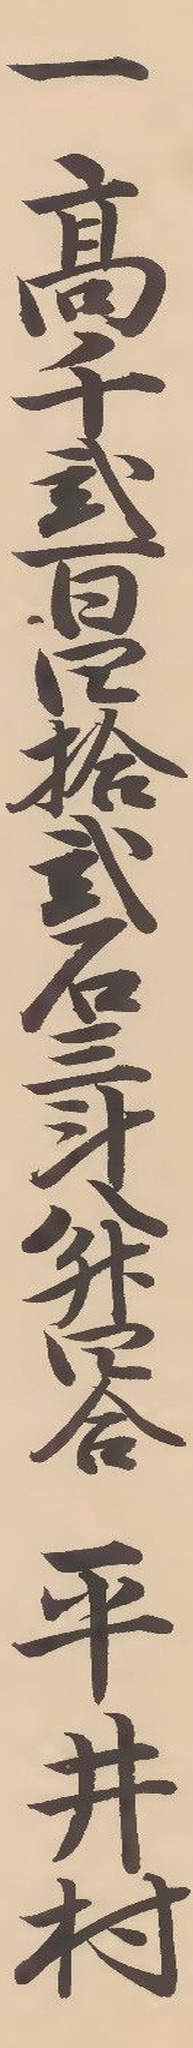一高千弐百四拾弐石三斗八升四合平井村
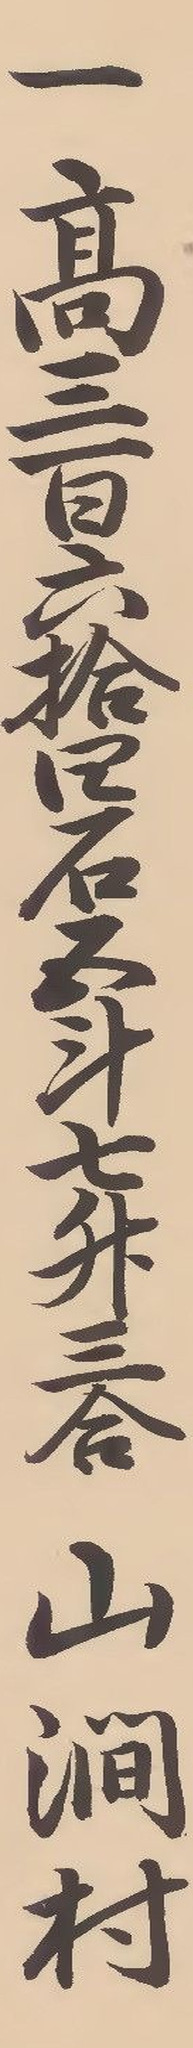一高三百六拾四石五斗七升三合山澗村
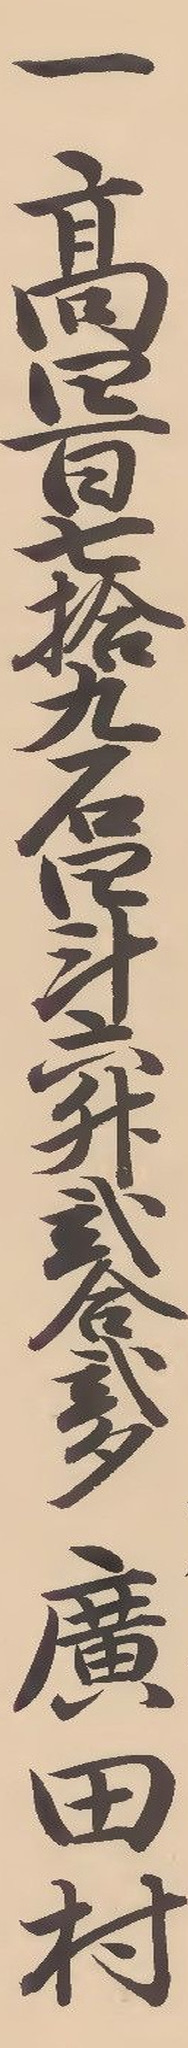一高四百七拾九石四斗六升弐合弐勺広田村
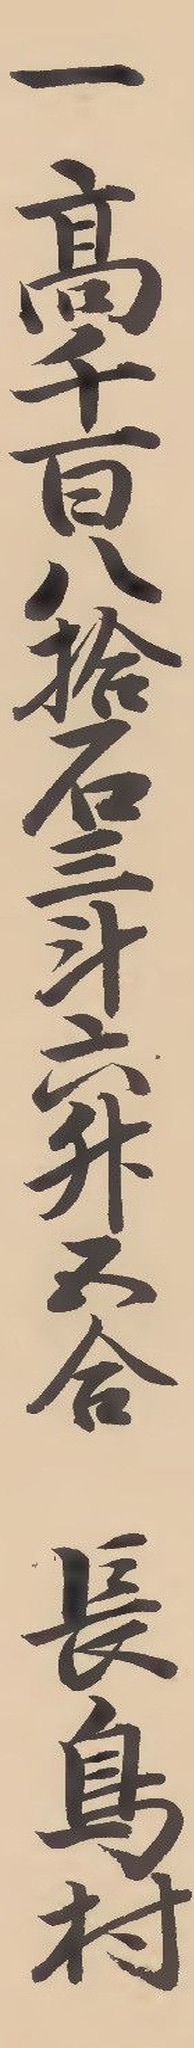一高千百八拾石三斗六升五合長鳥村
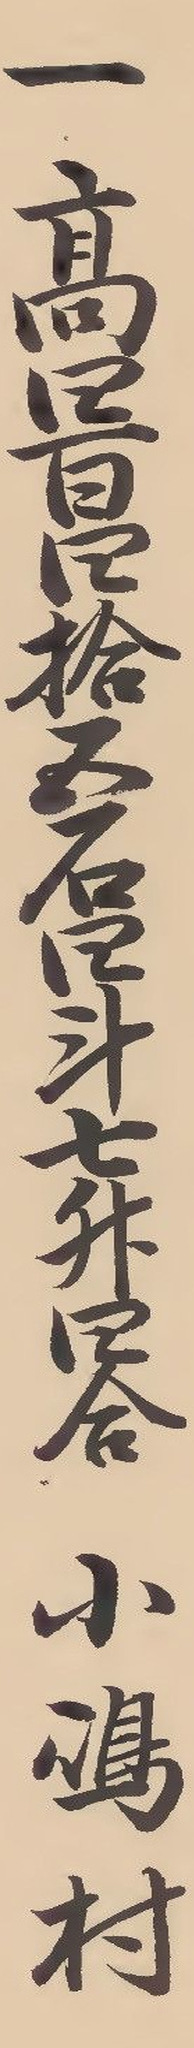一高四百四拾五石四斗七升四合小島村
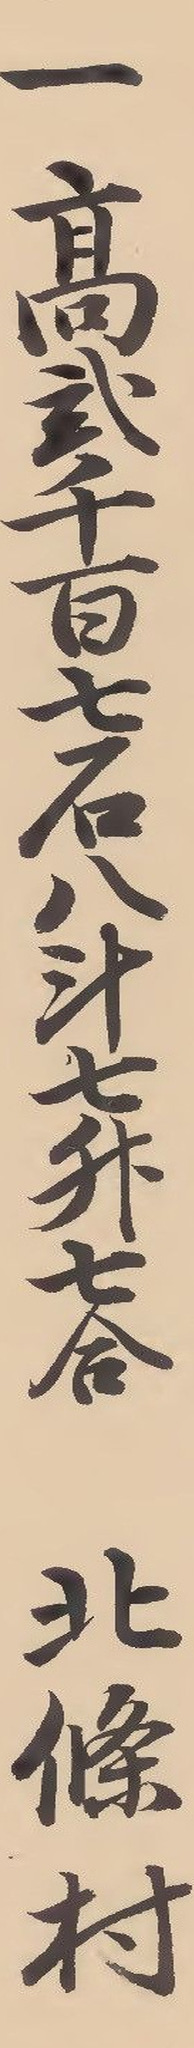一高弐千百七石八斗七升七合北条村
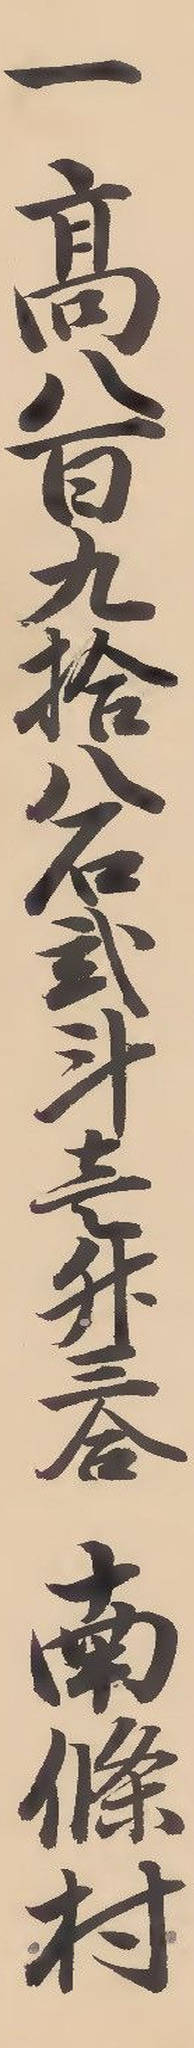一高八百九拾八石弐斗壱升三合南条村

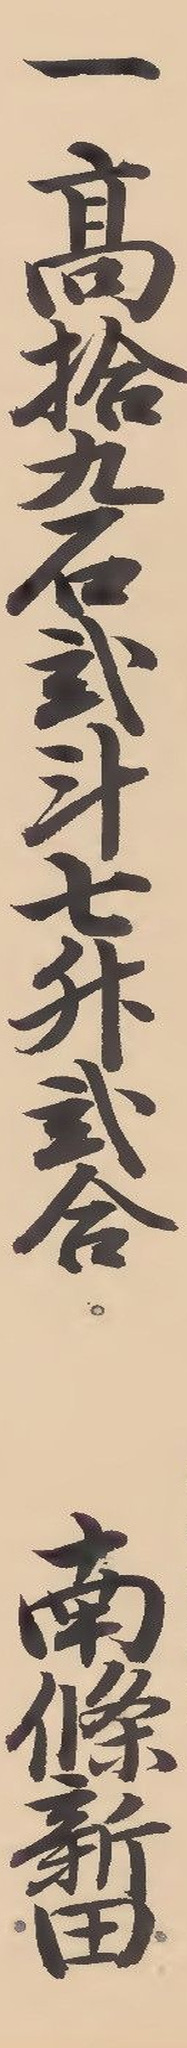一高拾九石弐斗七升弐合南条新田
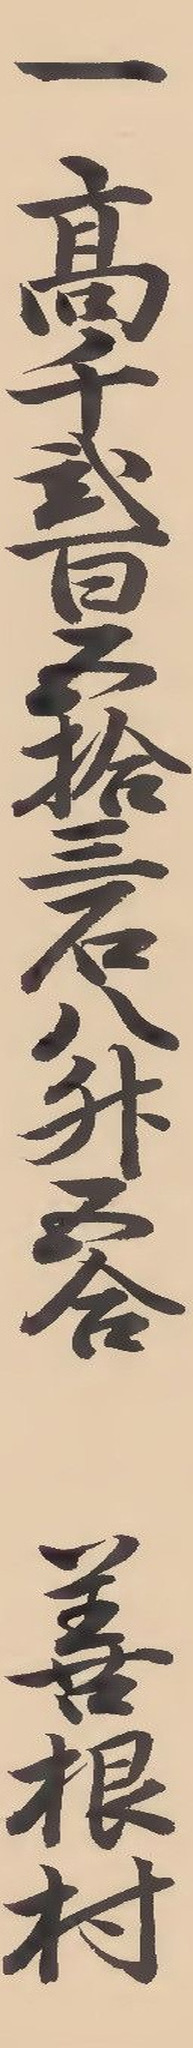一高千弐百五拾三石八升五合善根村
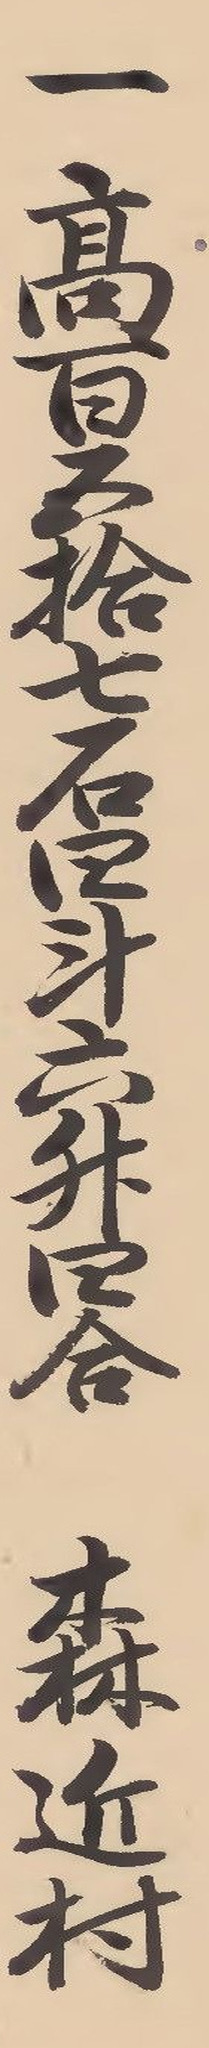一高百五拾七石四斗六升四合森近村
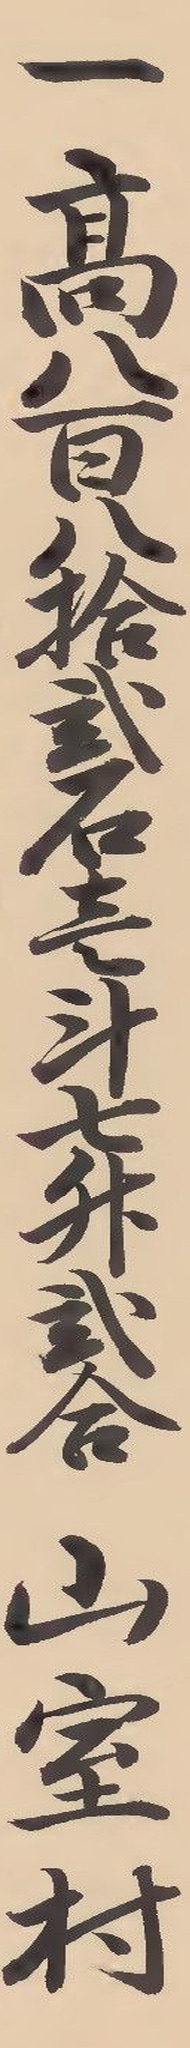一高八百八拾弐石壱斗七升弐合山室村
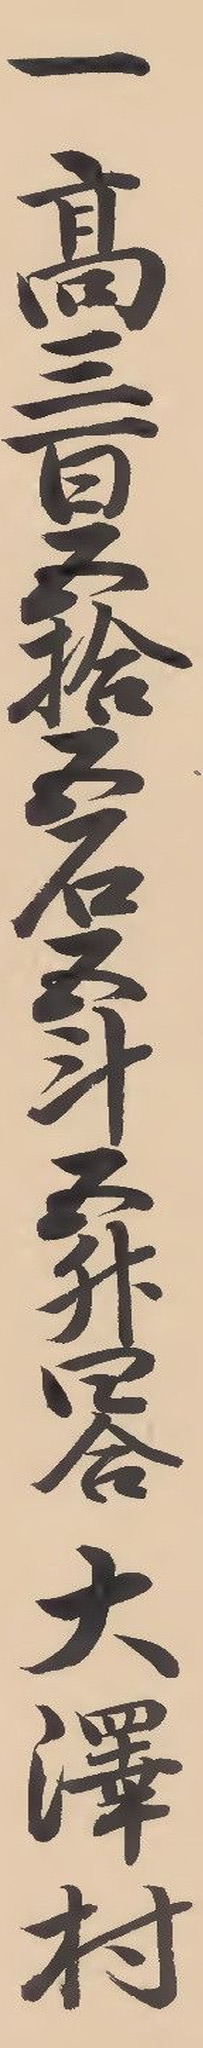一高三百五拾五石五斗五升四合大沢村
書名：越後国郷帳　中
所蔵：国立公文書館 National Archives of Japan
